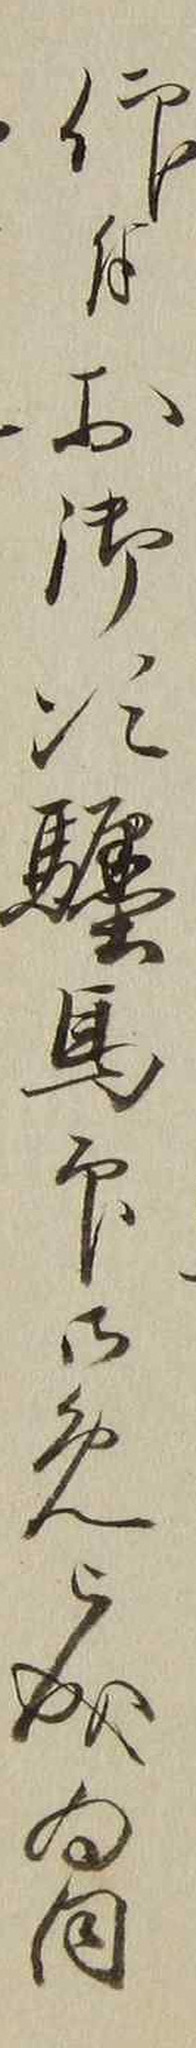仰付於御次馬印御免被成為同
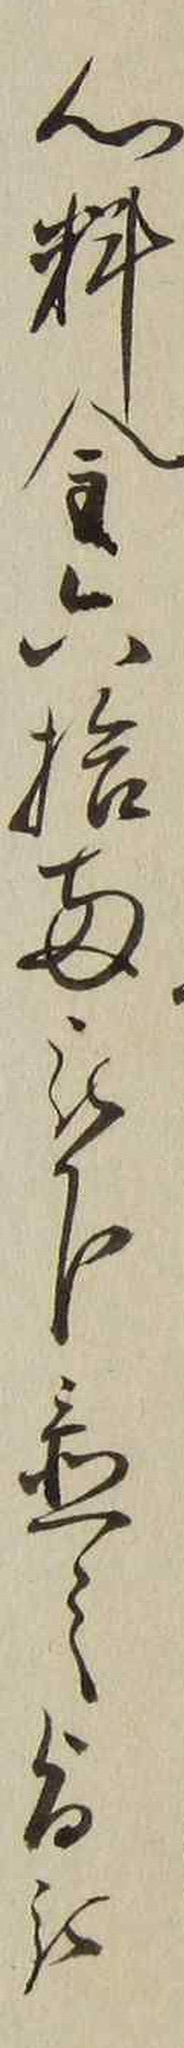心料金六拾両被下置之旨被
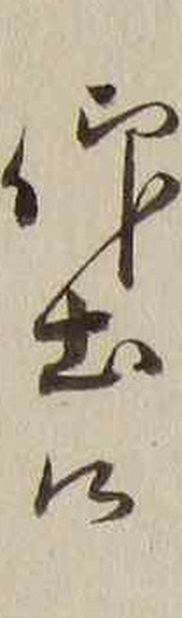仰出候
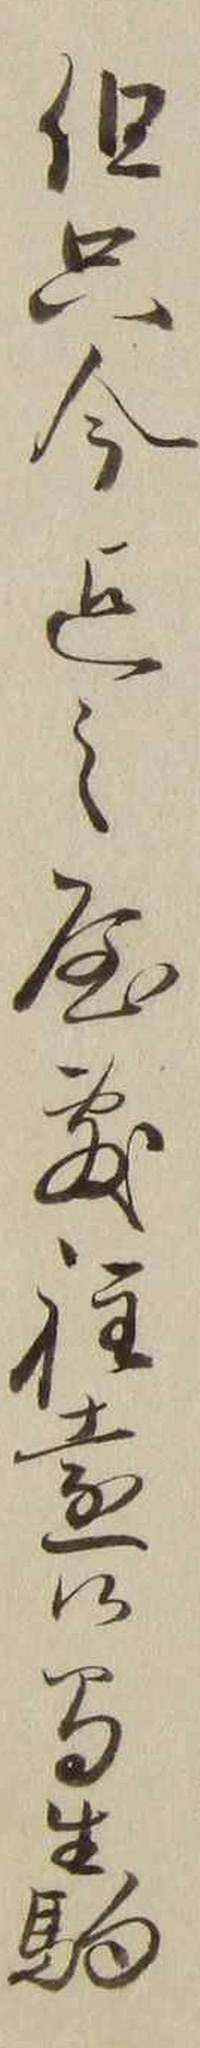但只今迄之屋敷程遠候間生駒

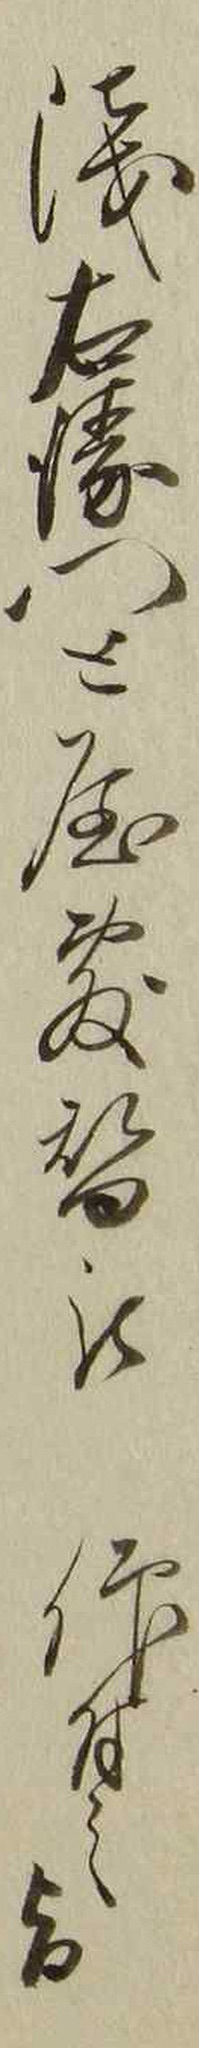浅右衛門と屋敷替被仰付之旨
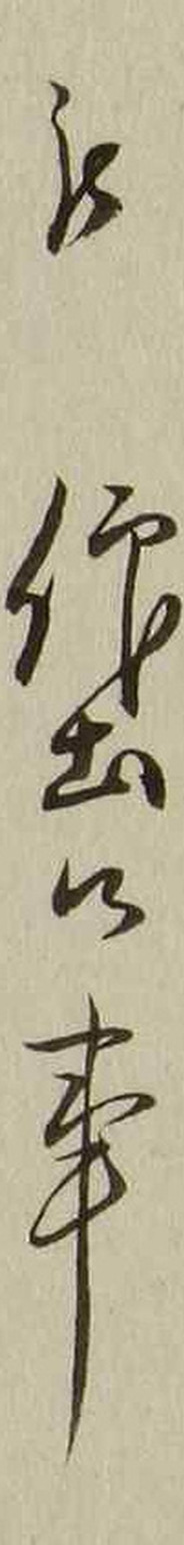被仰出候事
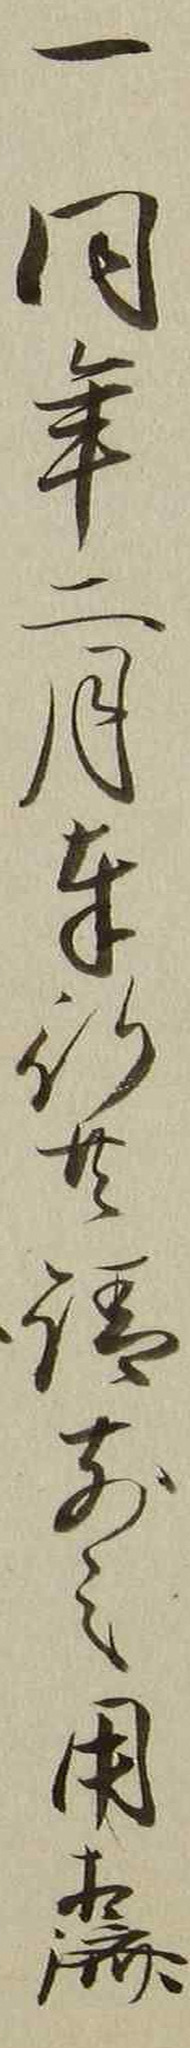一同年二月奉行共請前之用相済
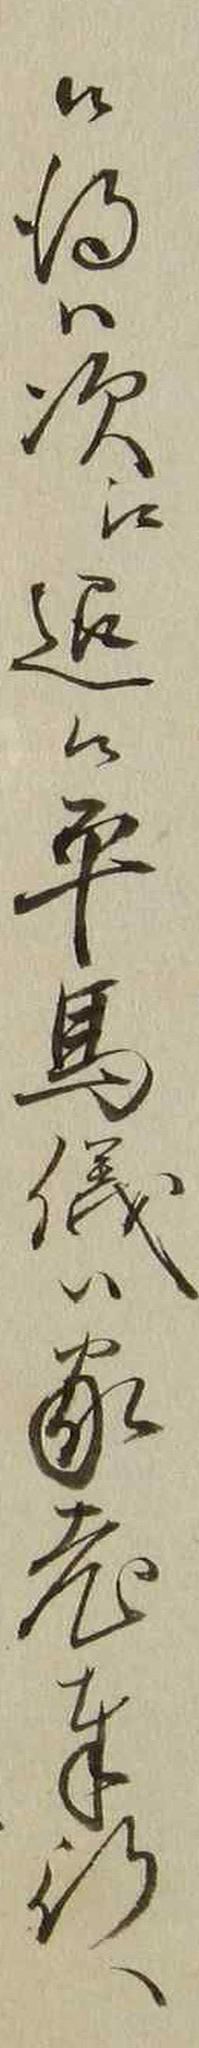候得は次江返候平馬儀は家老奉行へ
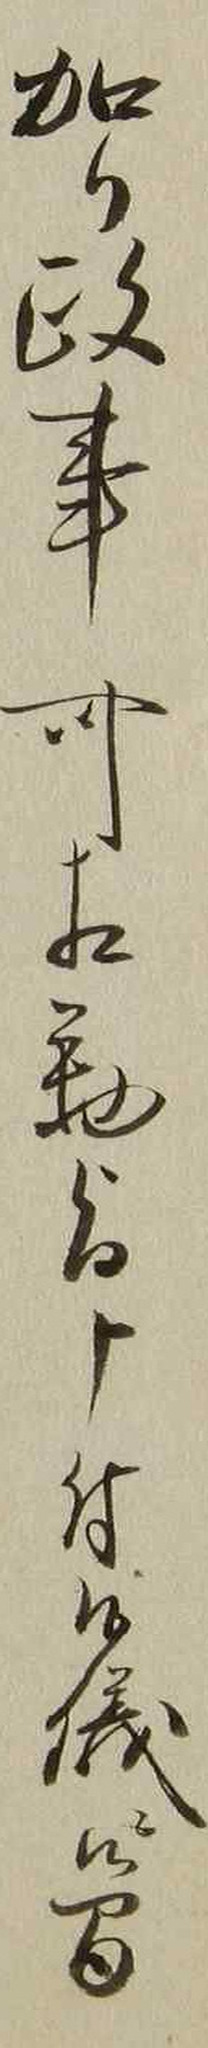加り政事可相勤旨申付候儀に候間
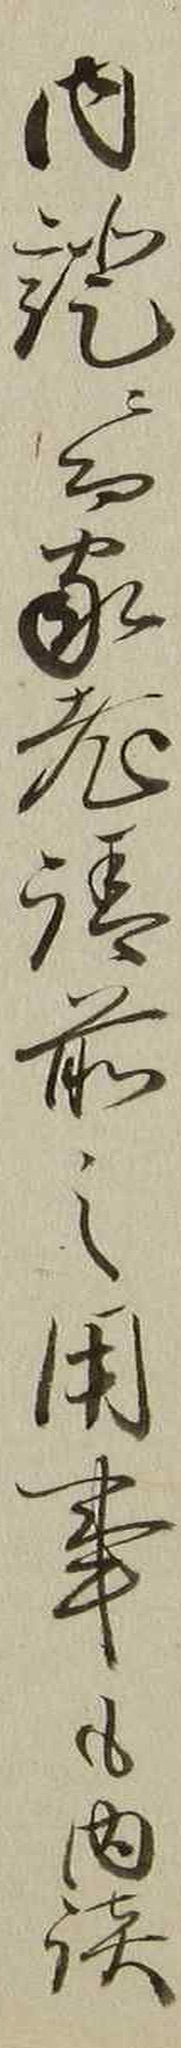内証に而家老請前之用事も内談
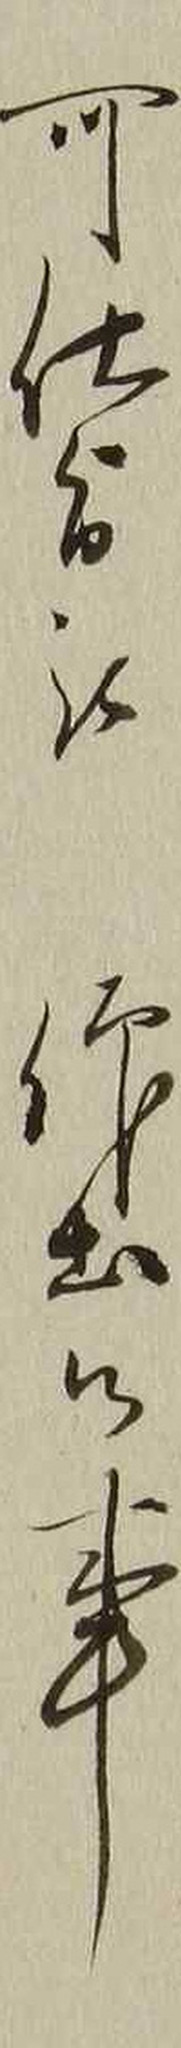可仕旨被仰出候事
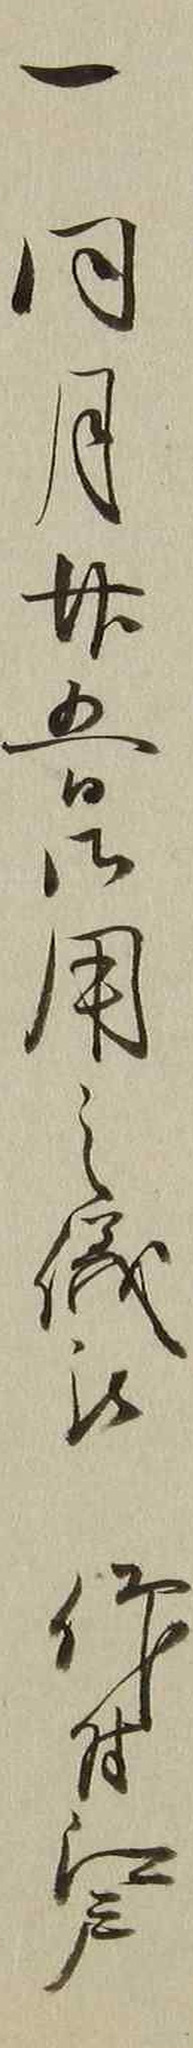一同月廿五日御用之儀被仰付江戸
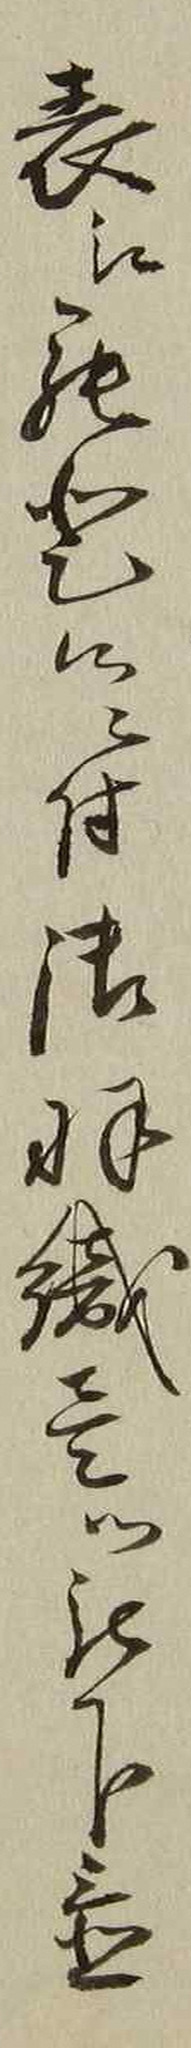表江罷登候に付御羽織壱つ被下置
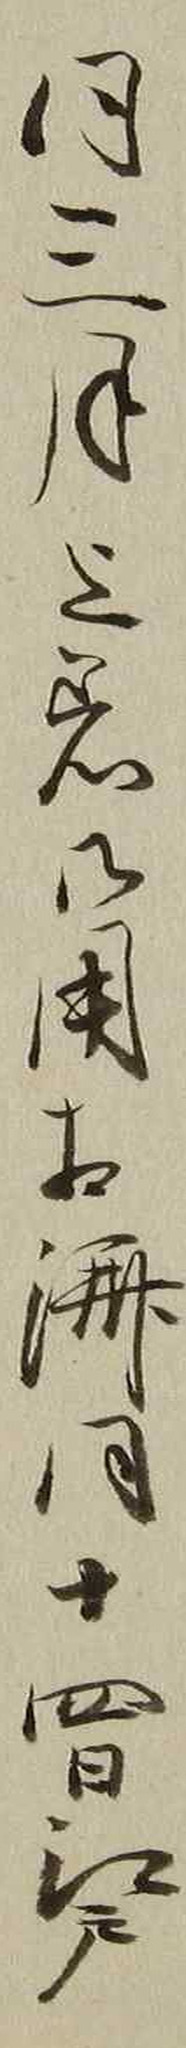同三月上着之御用相済同十四日江戸
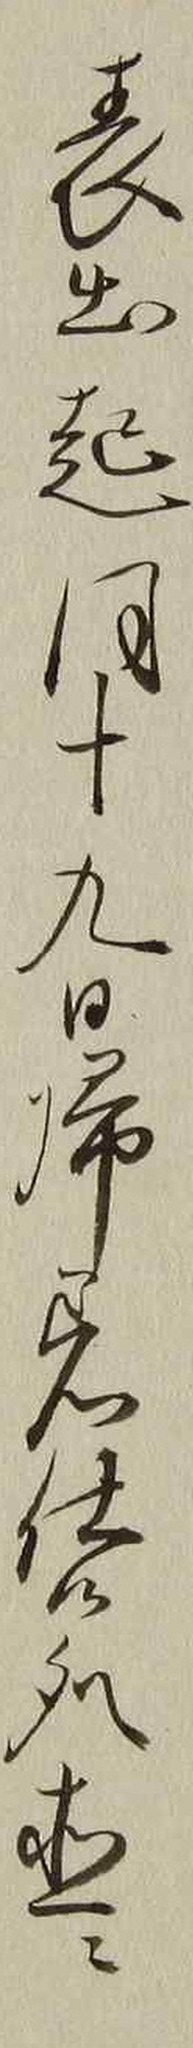表出起同十九日帰着仕候処直に
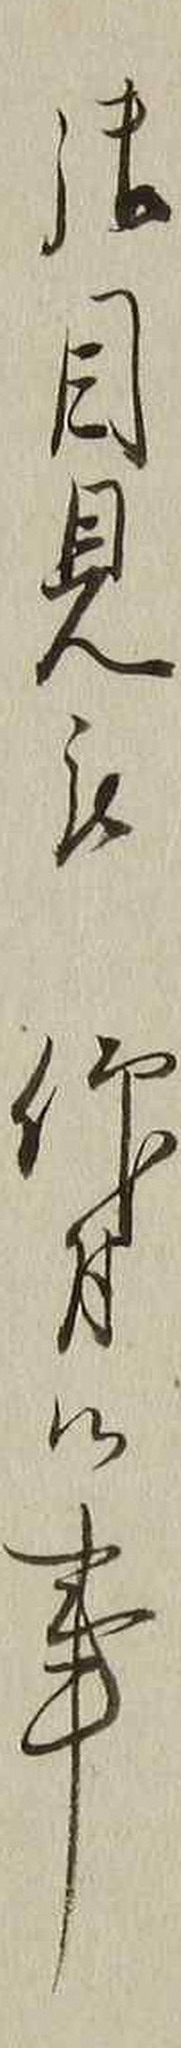御目見被仰付候事
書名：諸士系譜　巻之103　か之部11
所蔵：会津若松市立会津図書館
